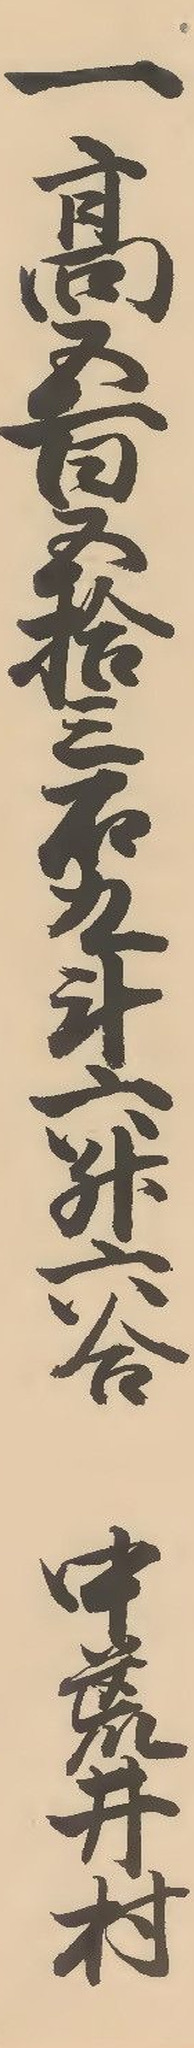一高五百五拾三石九斗六升六合中荒井村
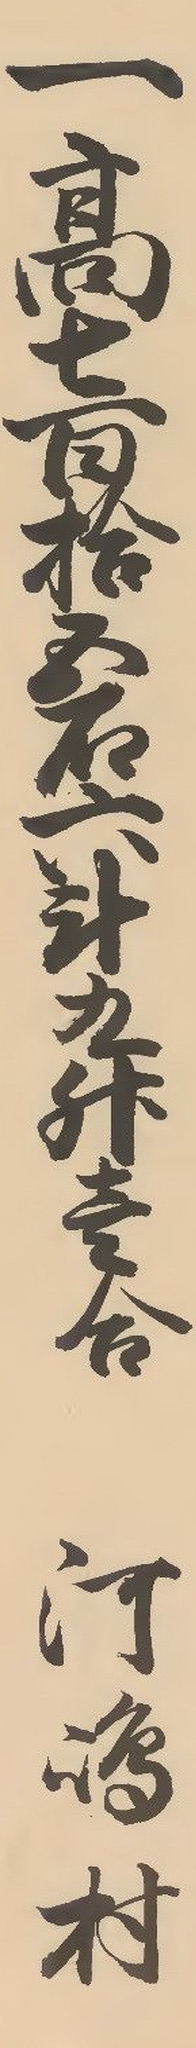一高七百拾五石六斗九升壱合河島村

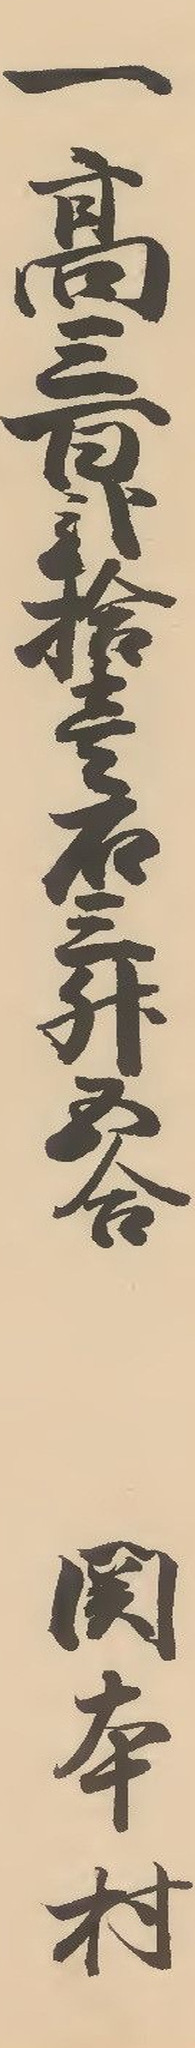一高三百弐拾壱石三升五合関本村
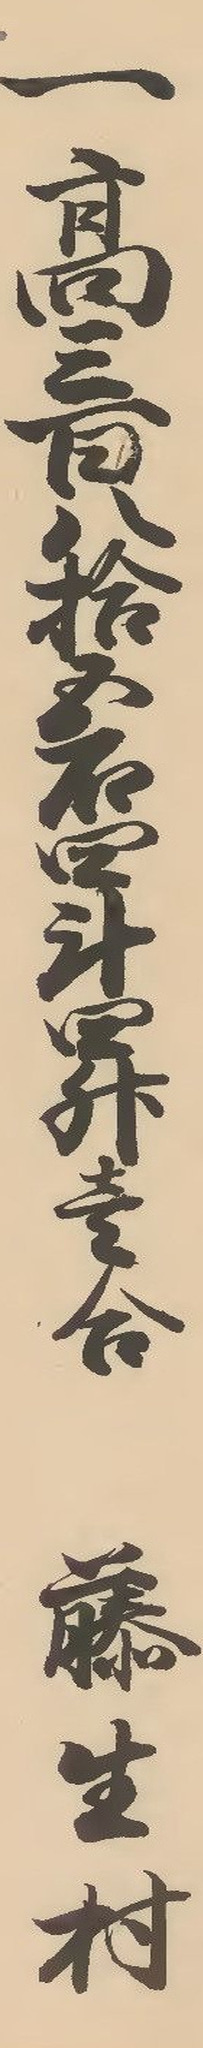一高三百八拾五石四斗四升壱合藤生村
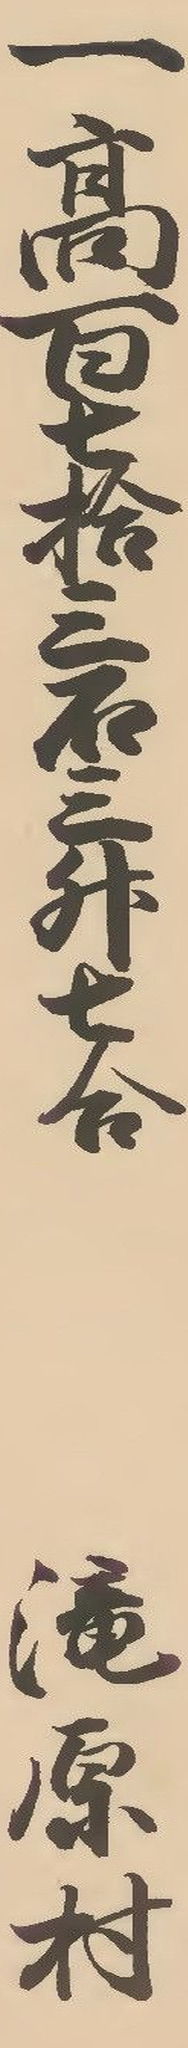一高百七拾三石三升七合滝原村
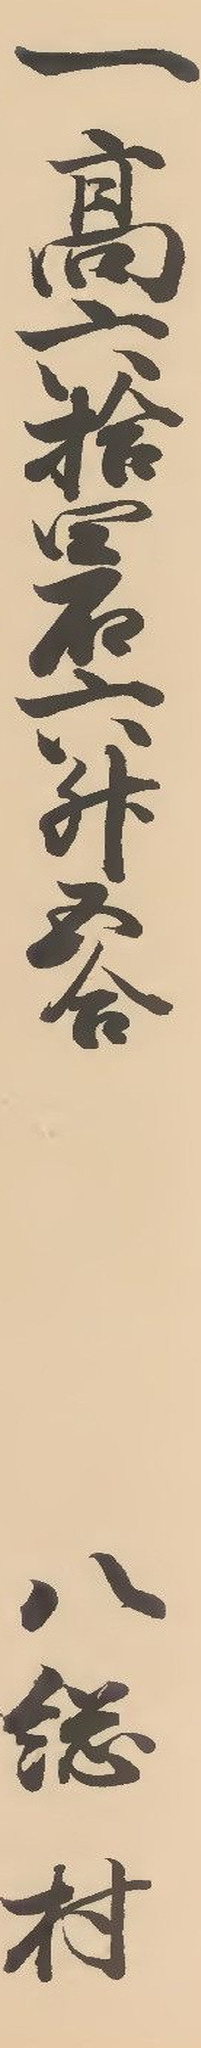一高六拾四石六升五合八総村
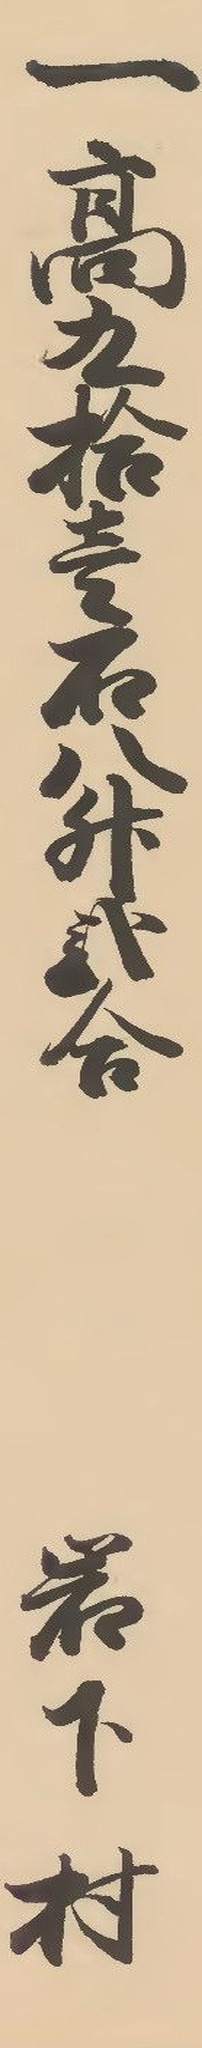一高九拾壱石八升弐合岩下村
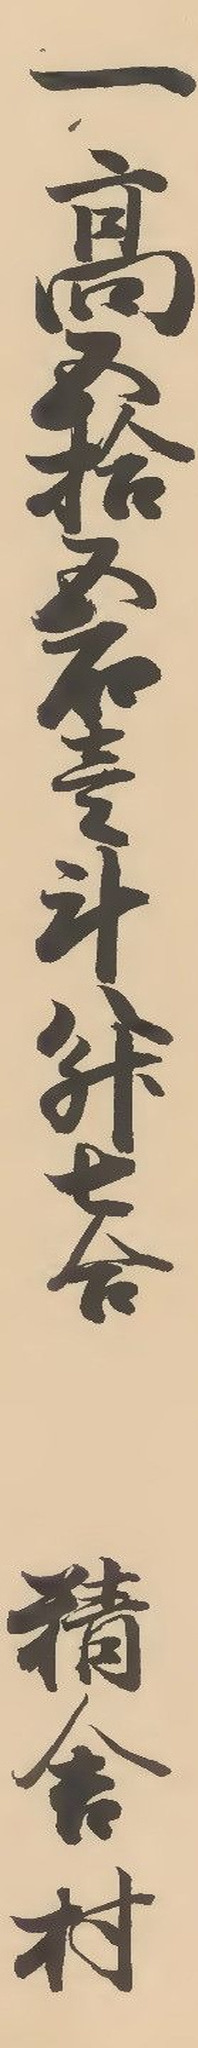一高五拾五石壱斗八升七合精舎村
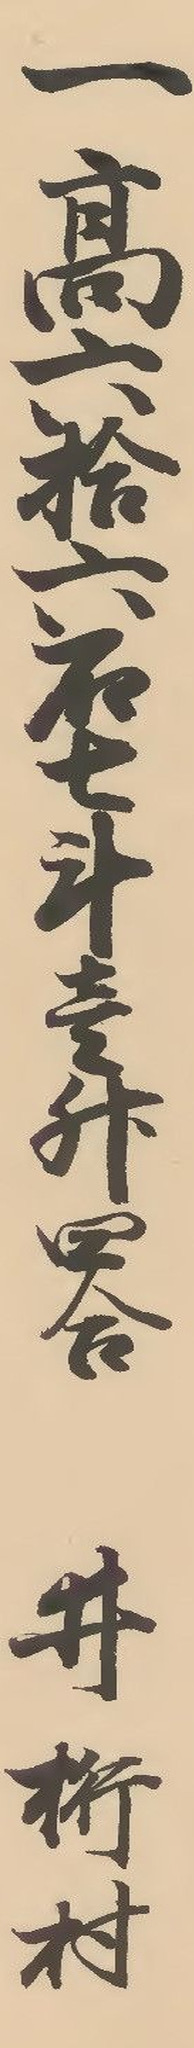一高六拾六石七斗壱升四合井桁村

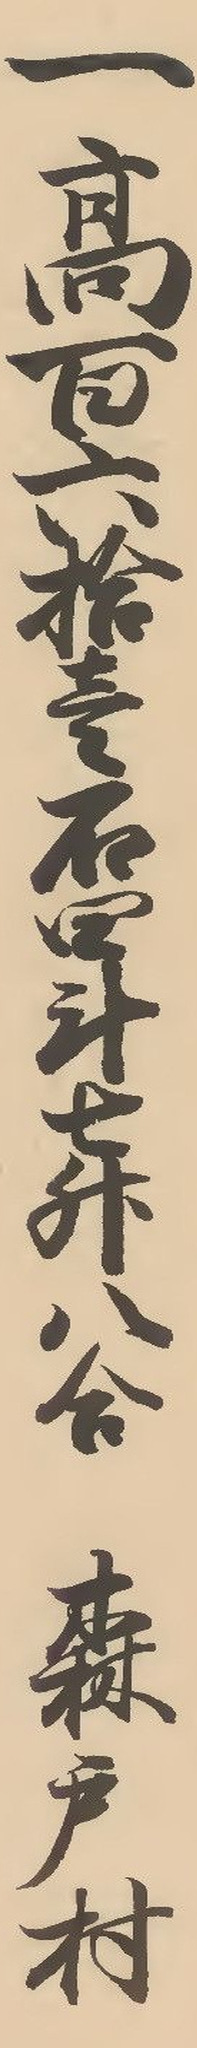一高百六拾壱石四斗七升八合森戸村
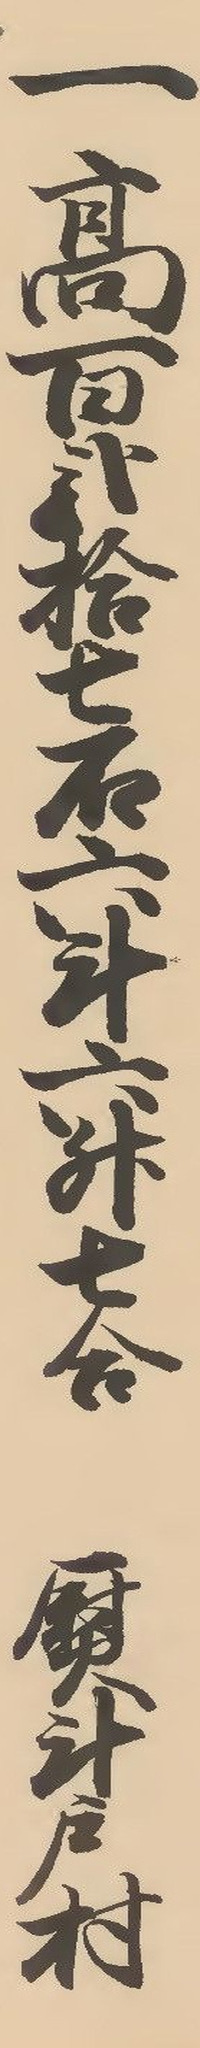一高百弐拾七石六斗六升七合熨斗戸村
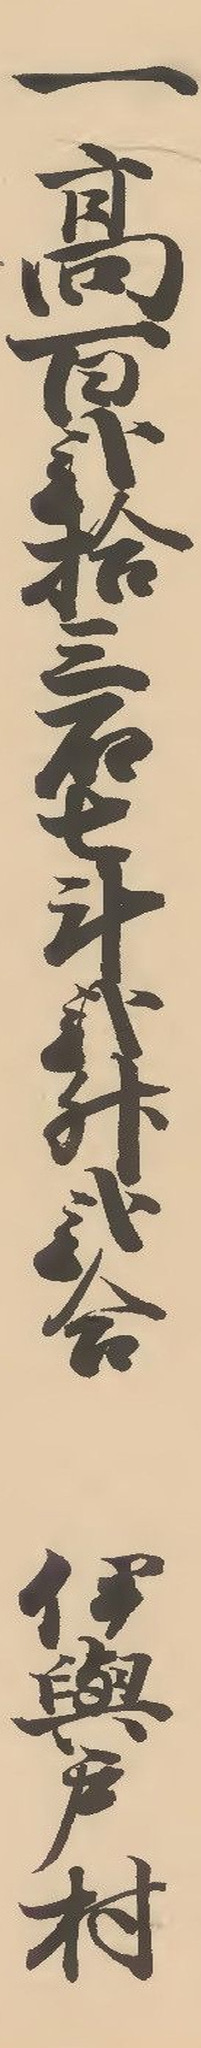一高百弐拾三石七斗弐升弐合伊与戸村
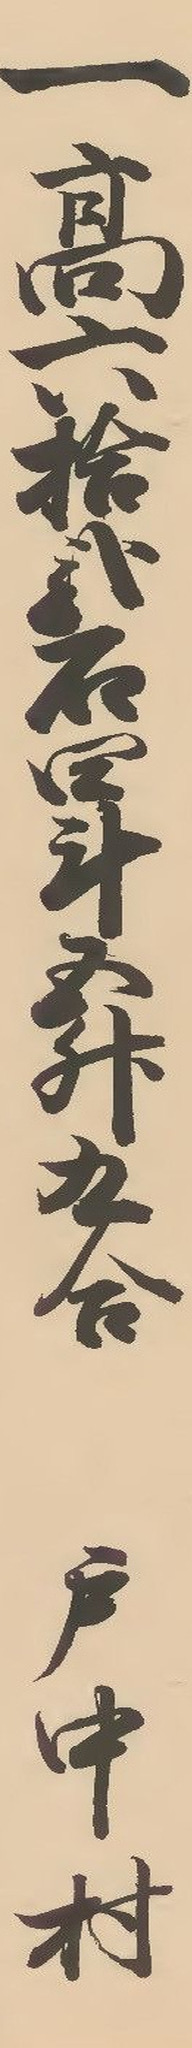一高六拾弐石四斗五升九合戸中村
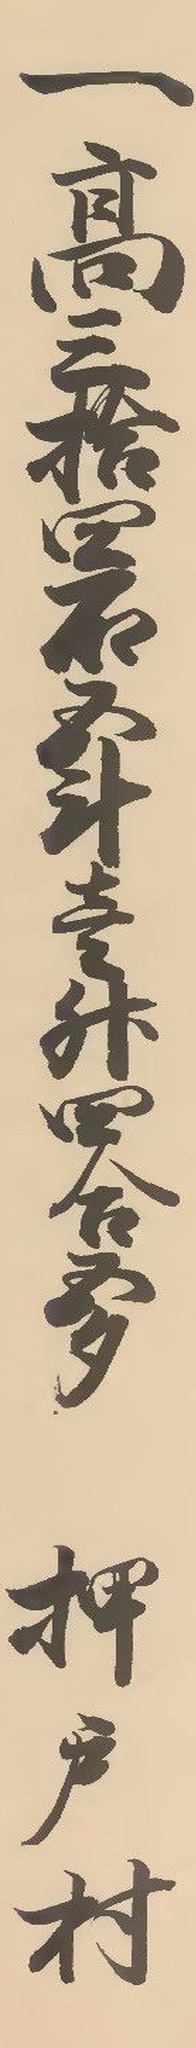一高三拾四石五斗壱升四合五勺押戸村
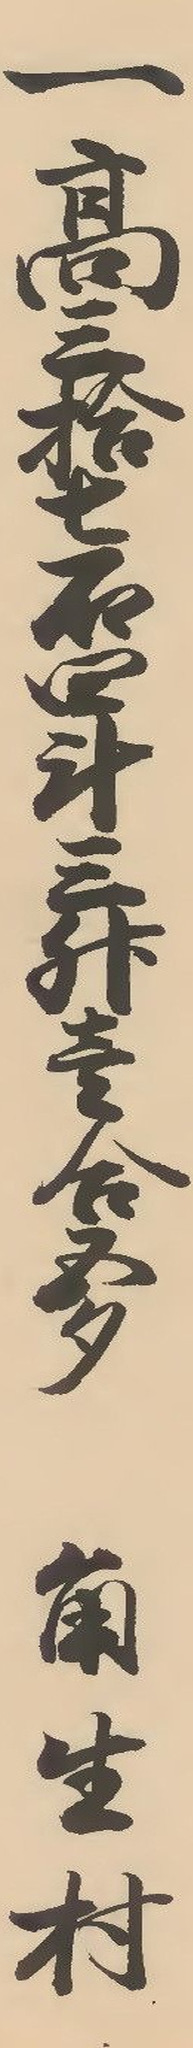一高三拾七石四斗三升壱合五勺角生村
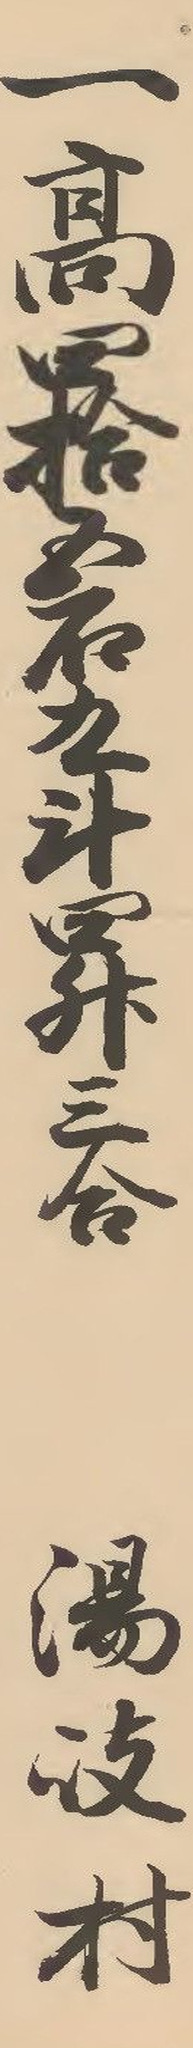一高四拾五石九斗四升三合湯岐村
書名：陸奥国郷帳　１
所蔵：国立公文書館 National Archives of Japan
